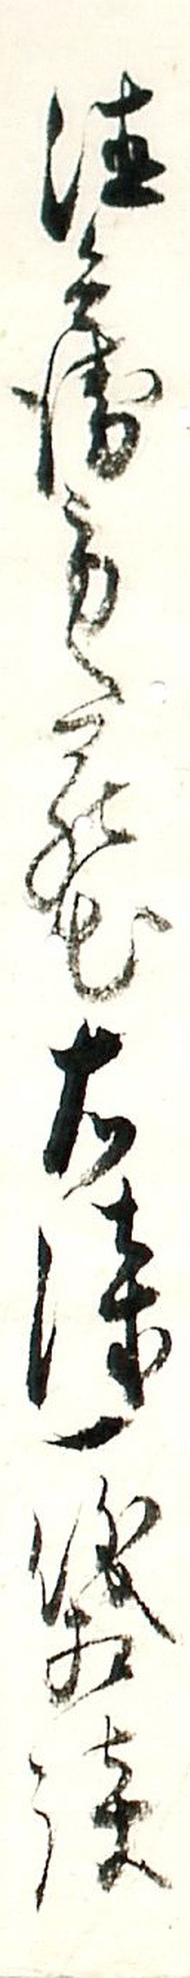徳兵衛方へ罷出右漆一儀相談
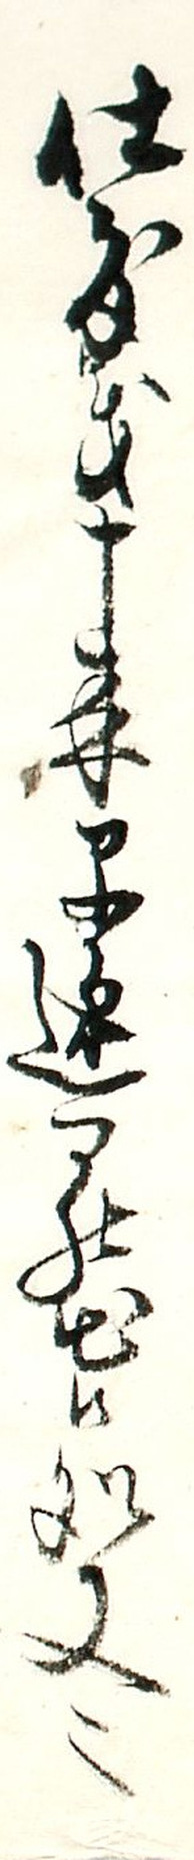仕度義申来早速罷出候処又々
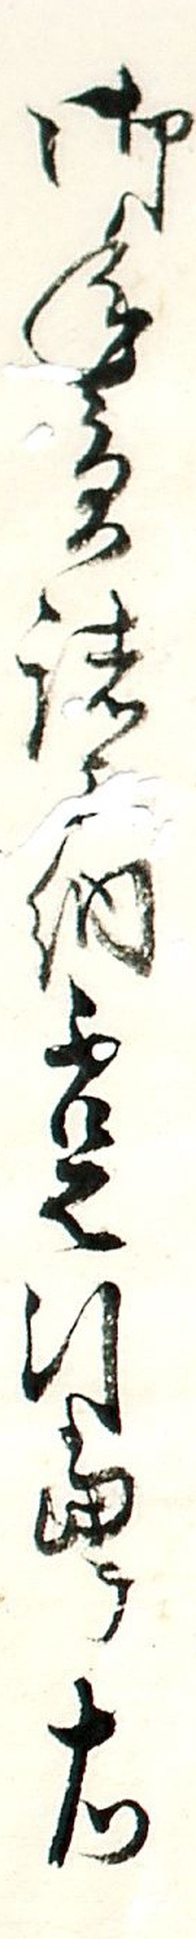御年貢諸上納不足引当て右
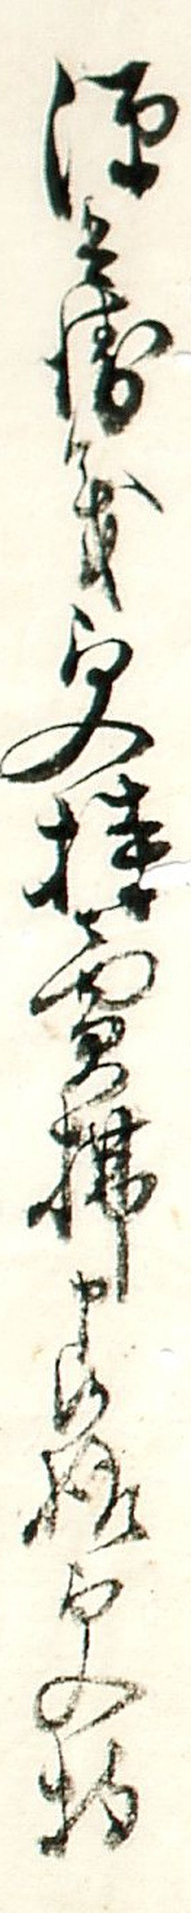源兵衛義受持売払申候様受持
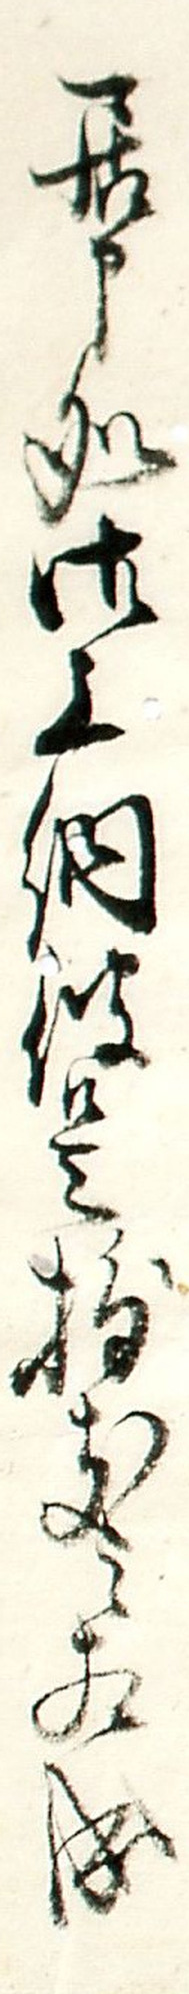居申処御上納彼是指支に相成
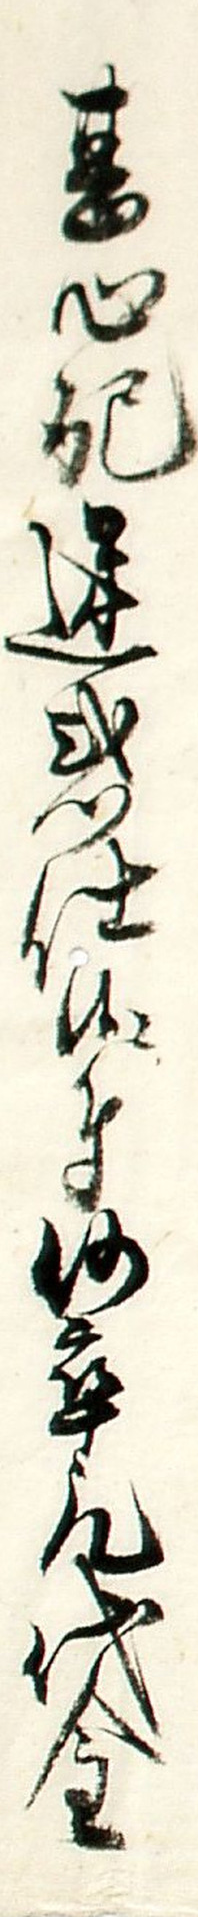甚心配迷惑仕候に付何卒凡代金
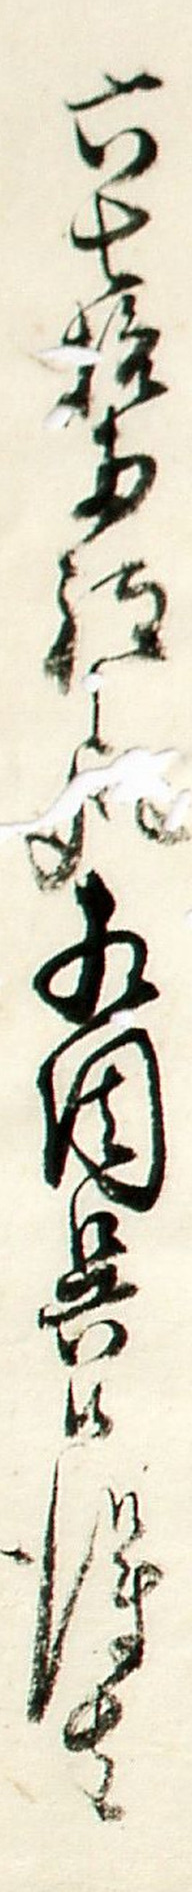六七拾両程之処相調呉候得は
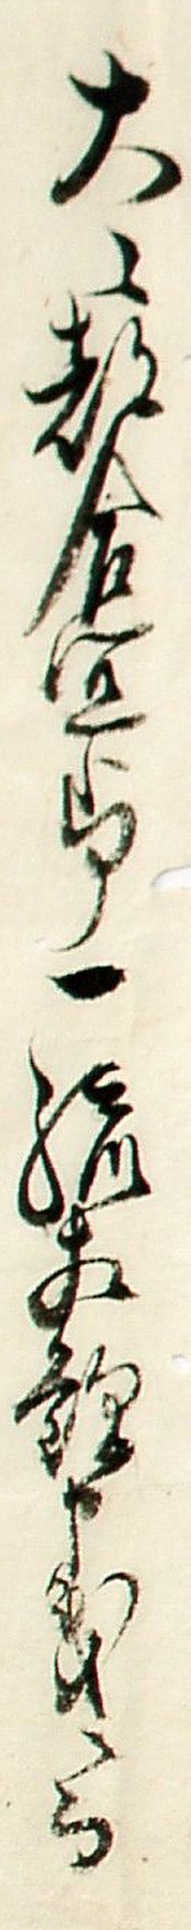大に都合宜布一統相歎申義に而

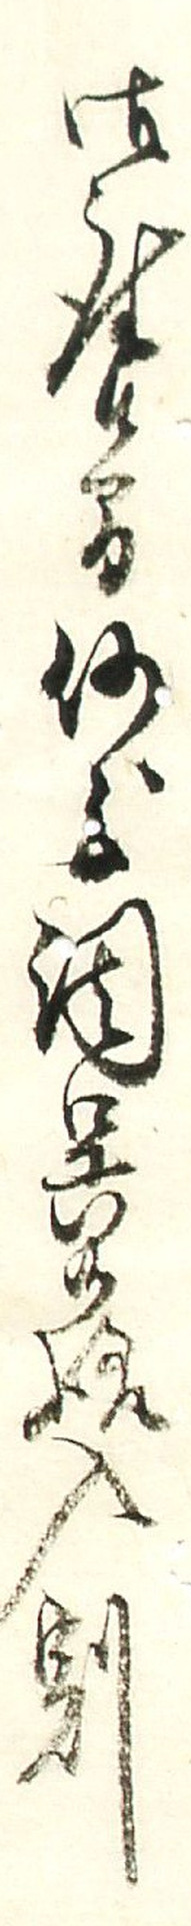御座候間何分調呉候様入割
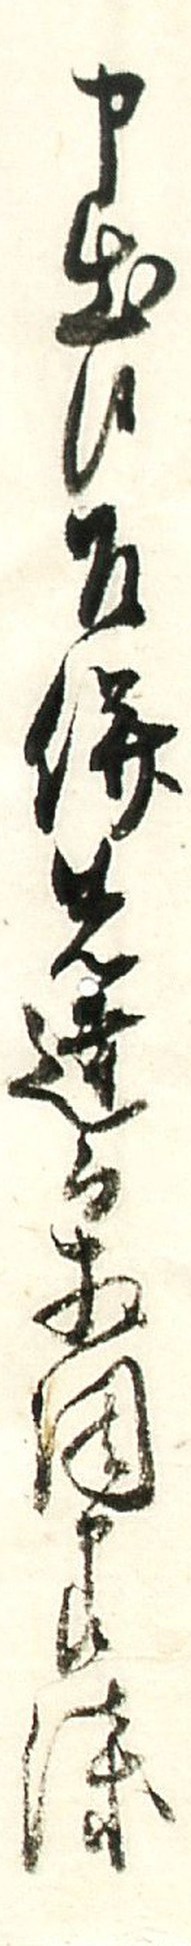申出候乍併先達而相調申候漆
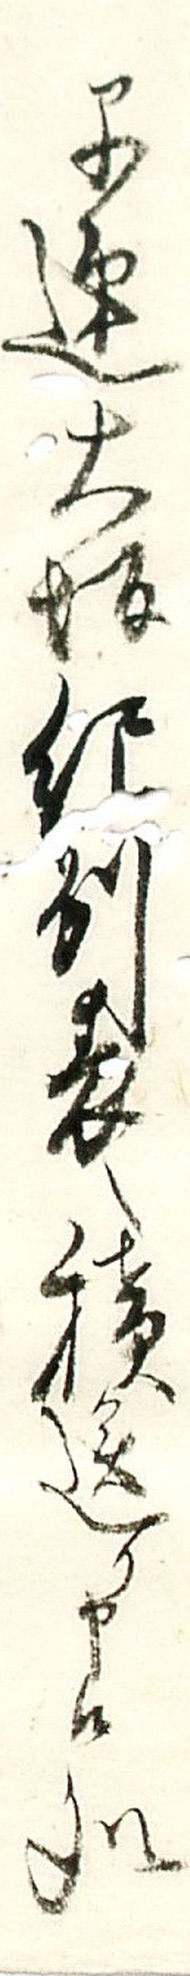早速大坂紀州表へ積送り申候処
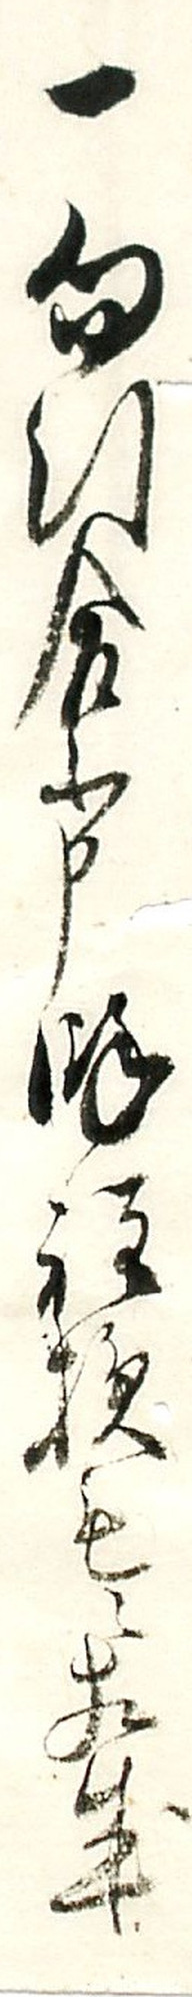一向引合不申余程損耗に相成
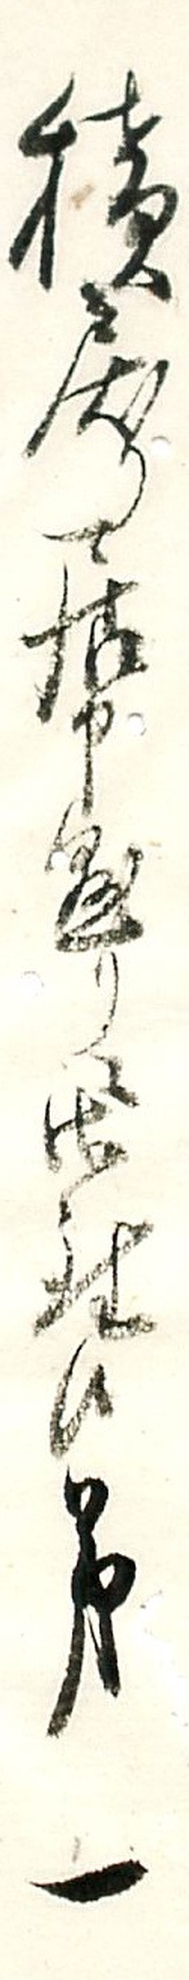積戻り居申懸りに御座候第一
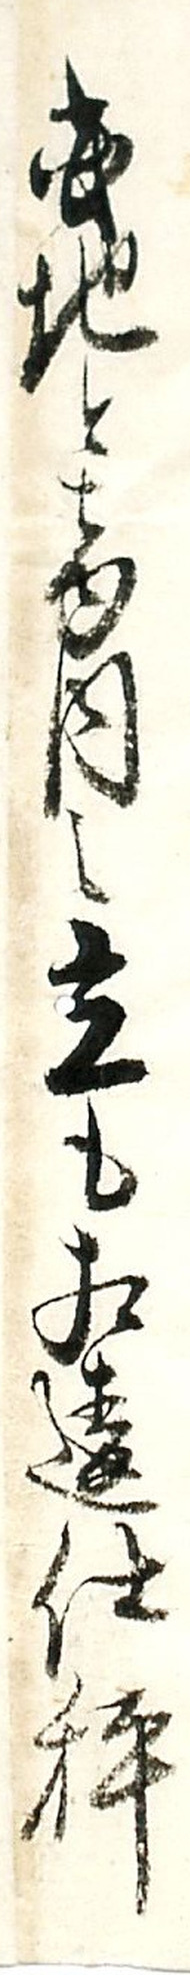当地と商内之立も相違仕秤
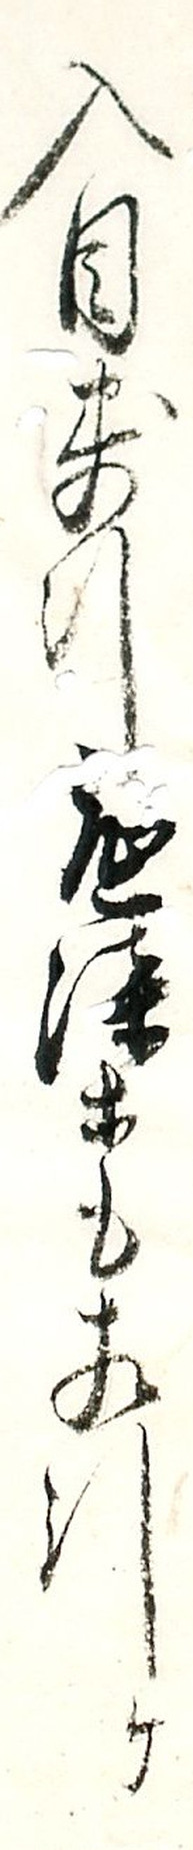入目歩引庭漆等も相引け
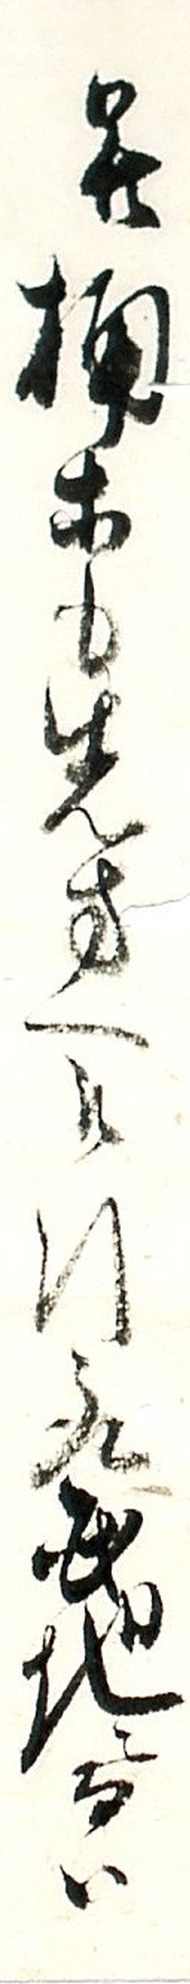幷桶等も先方へ被引取当地に而は
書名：乍恐横切ヲ以奉申上覚（山城谷漆買入銀一件ニ付）
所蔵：鳴門教育大学 Naruto University of Education
